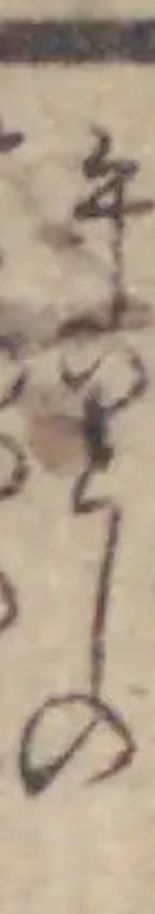午にいとしの
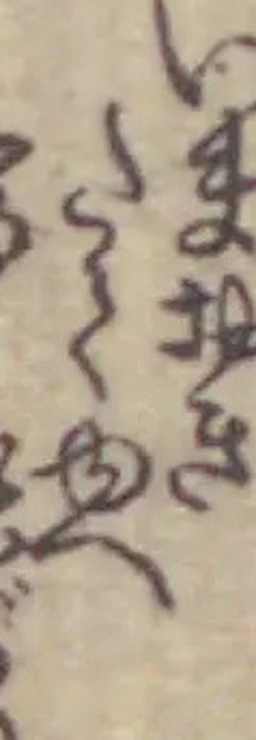たてゆへ
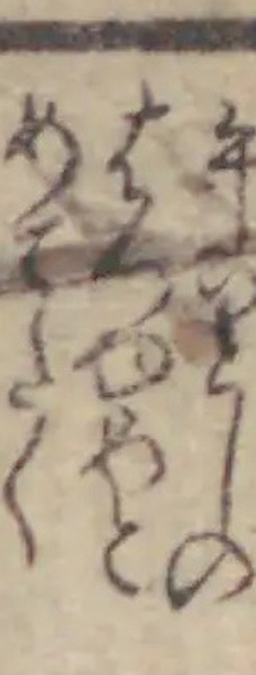はつゆめと
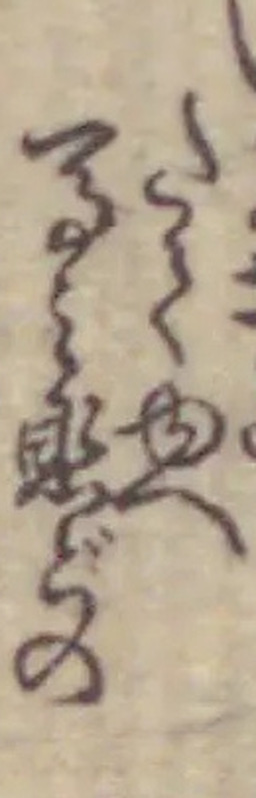馬之丞どの
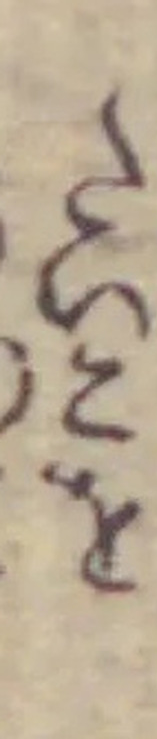たいこを
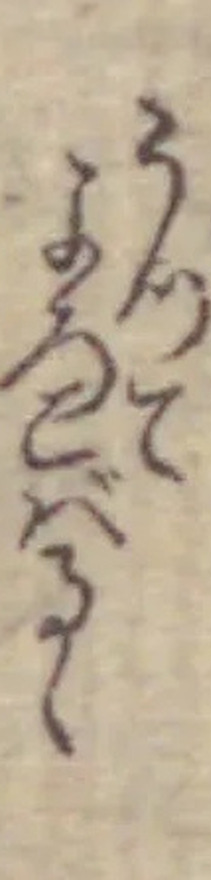よろこばるゝ
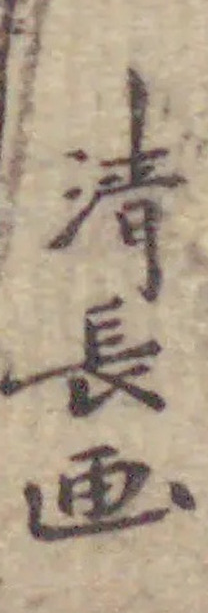清長画
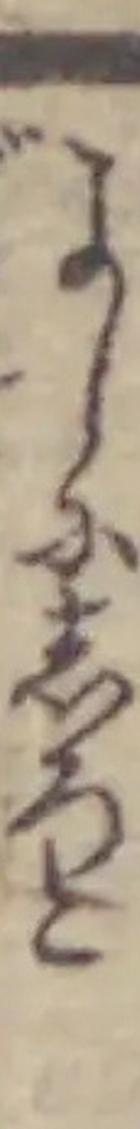よしにしろと
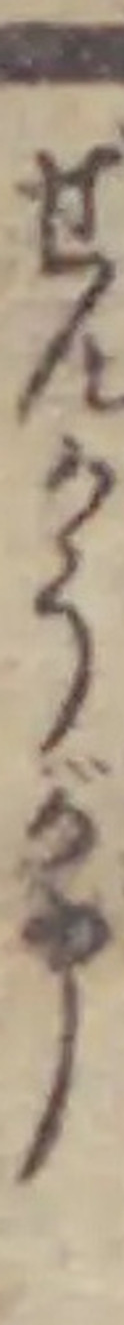ぜんかうか申し
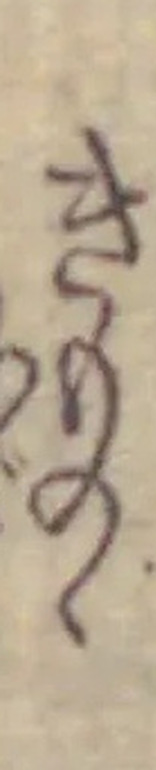きものゝ
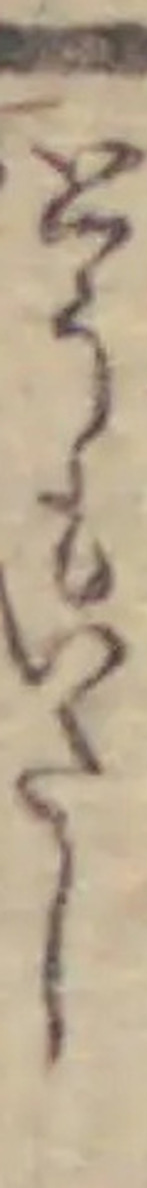とうもいたし
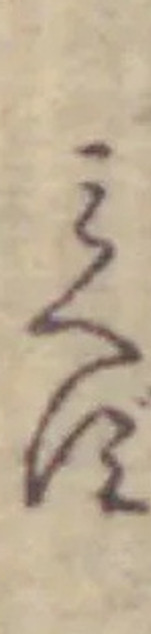みへず
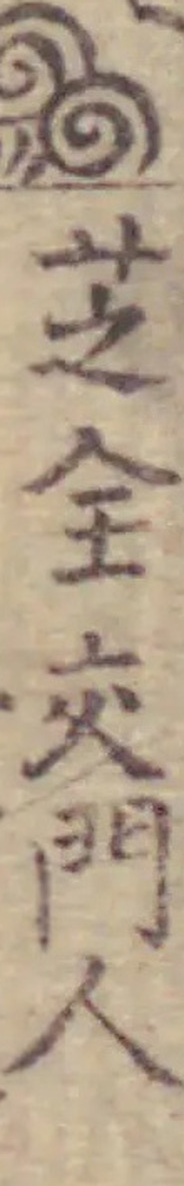芝全交門人
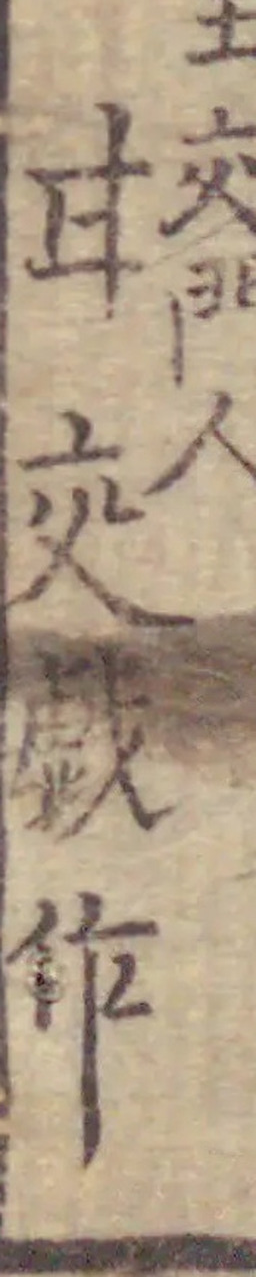甘交戯作
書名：道笑双六
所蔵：国立国会図書館 National Diet Library, JAPAN
